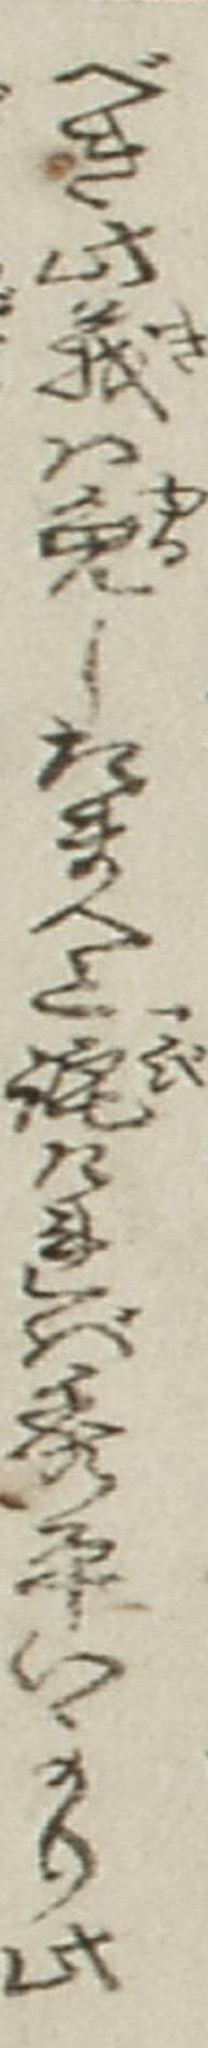べき此義は免したまへと詫たれば秀平いかり此
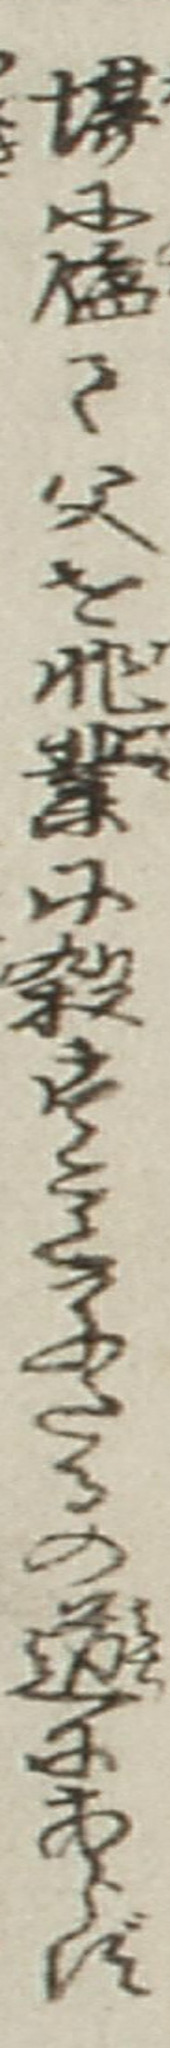場に臨て父を非業に殺すこと子たるの道にあらず
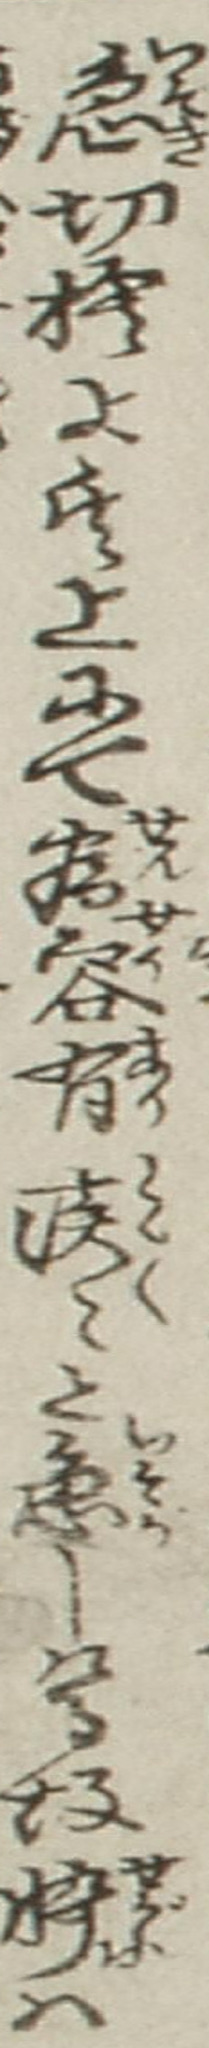急切捨よ其上にて為容有疾々と急しける故忰は
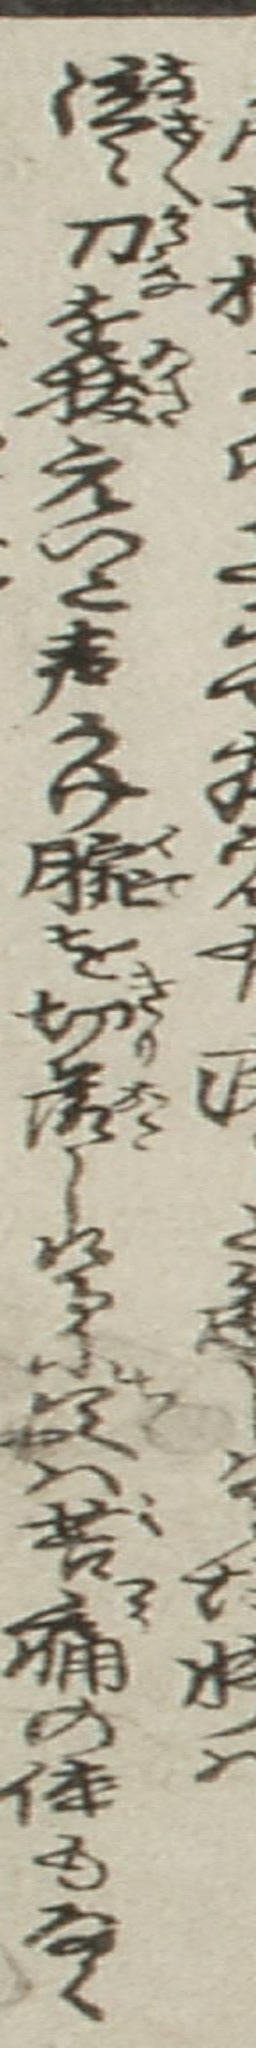泣々刀を抜えいと声かけ腕を切落しけるに父は苦痛の体もなく
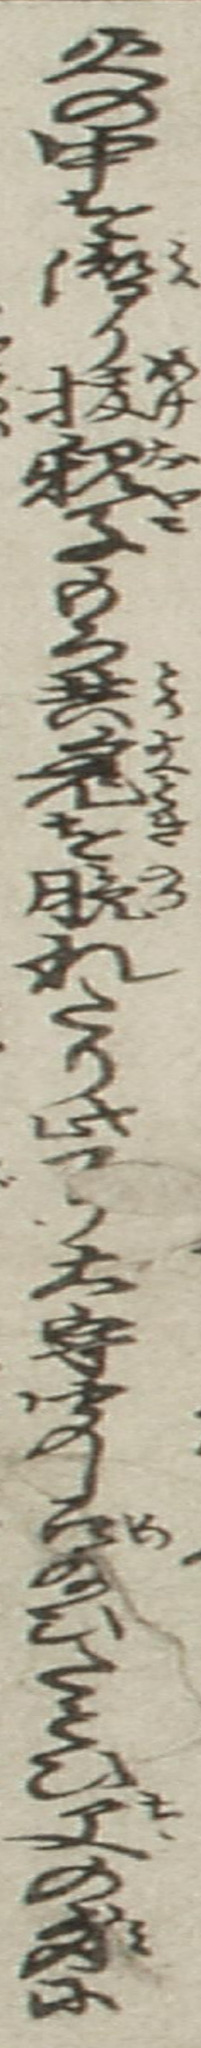火の中を潜り抜親子もろ共危を脱れたり此事太守聞し召給ひたとひ父の身に

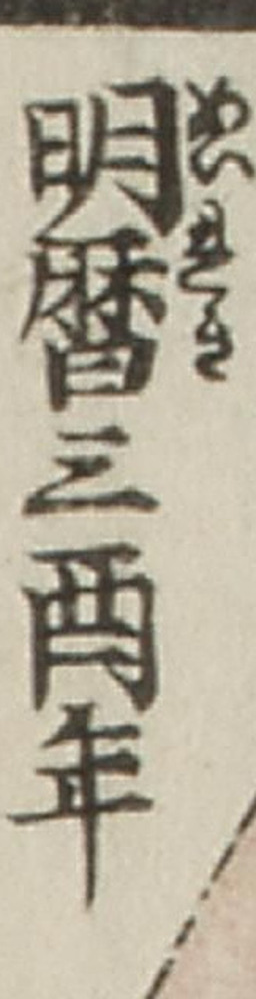明暦三酉年
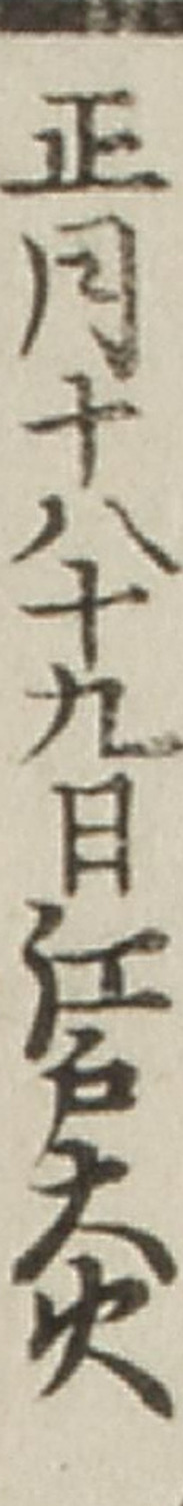正月十八十九日江戸大火
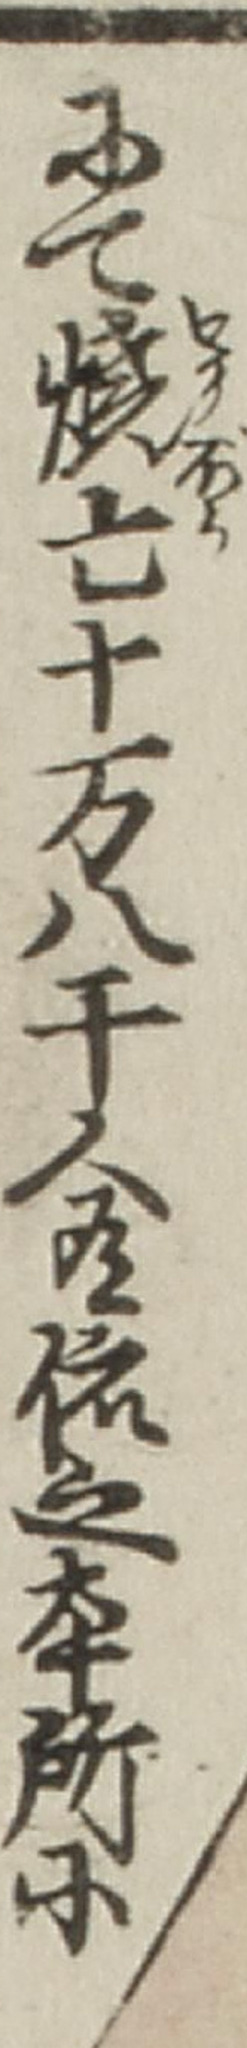にて焼亡十万八千人有依之本所に
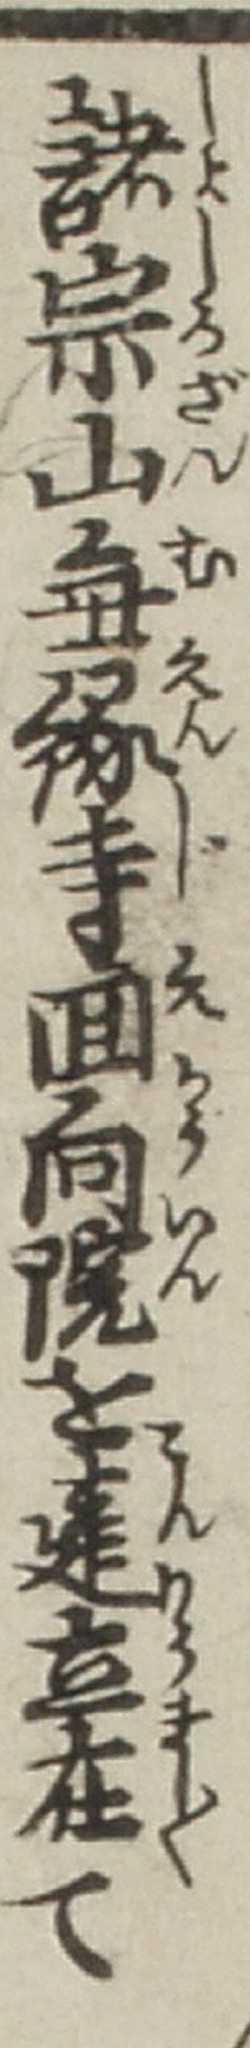諸宗山無縁寺回向院を建立在て
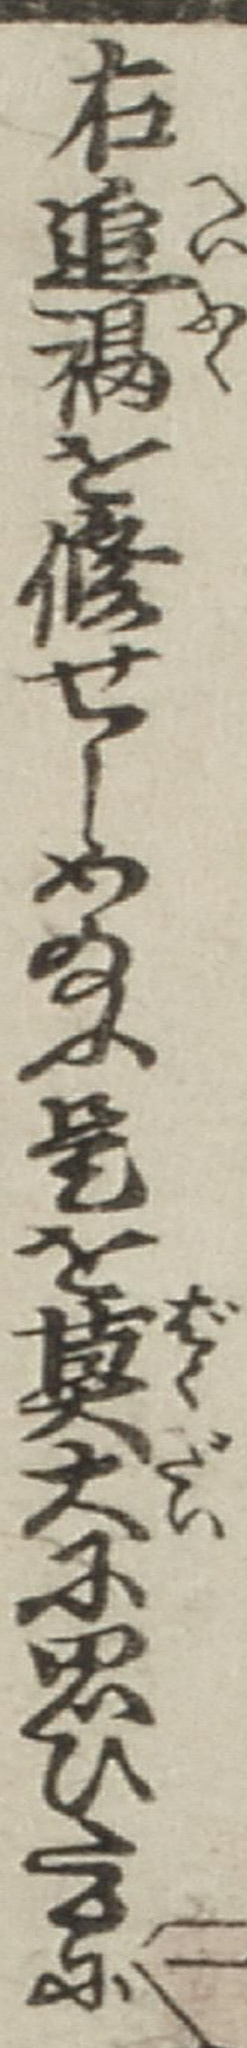右追福を修せしめ給ふ是を莫大に思ひたるに
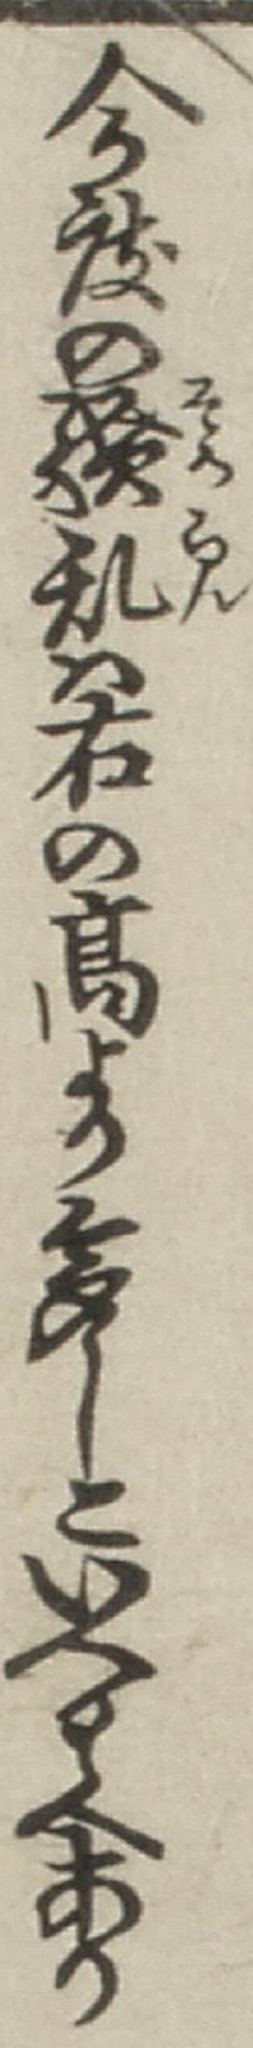今度の騒乱は右の高より多しといへる人あり
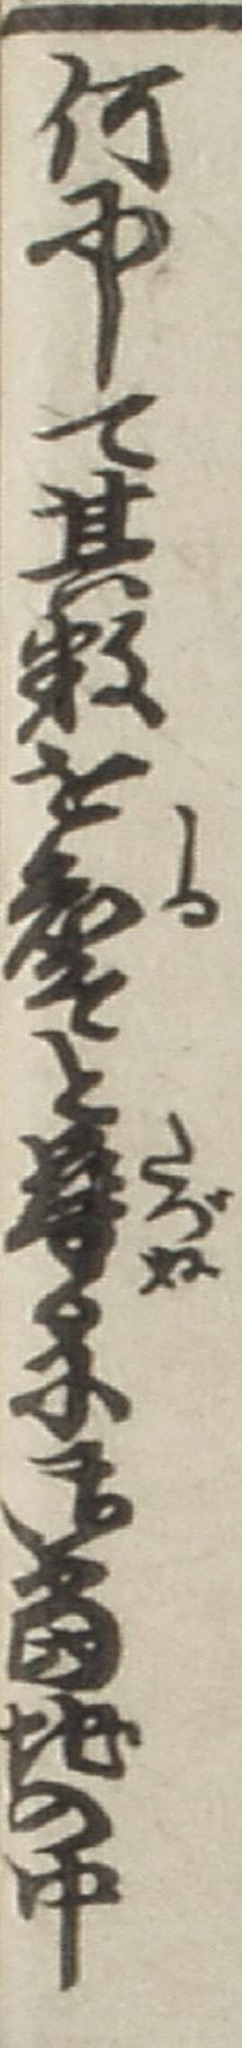何にして其数を知そと尋るに御当地の中
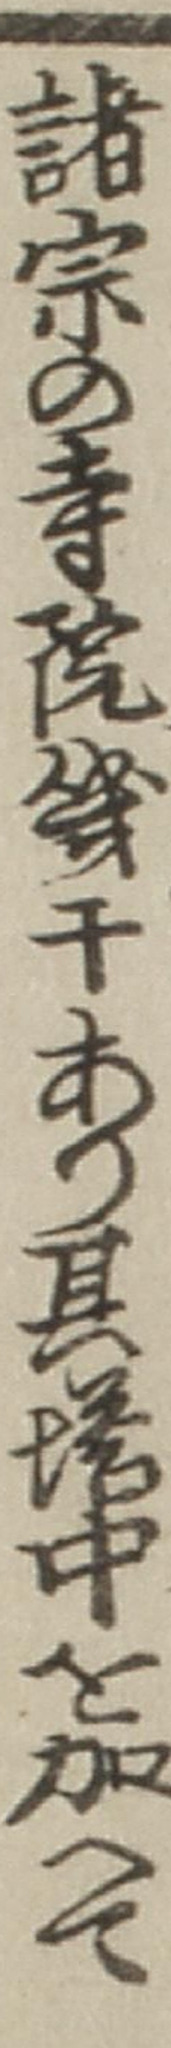諸宗の寺院幾千あり其塔中を加へて
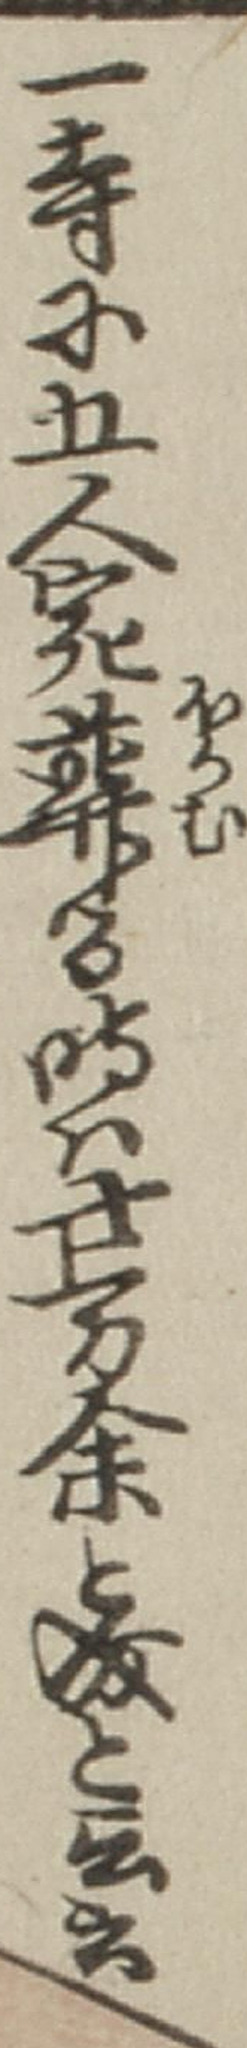一寺に五人宛葬る時は廿万余と成と云云
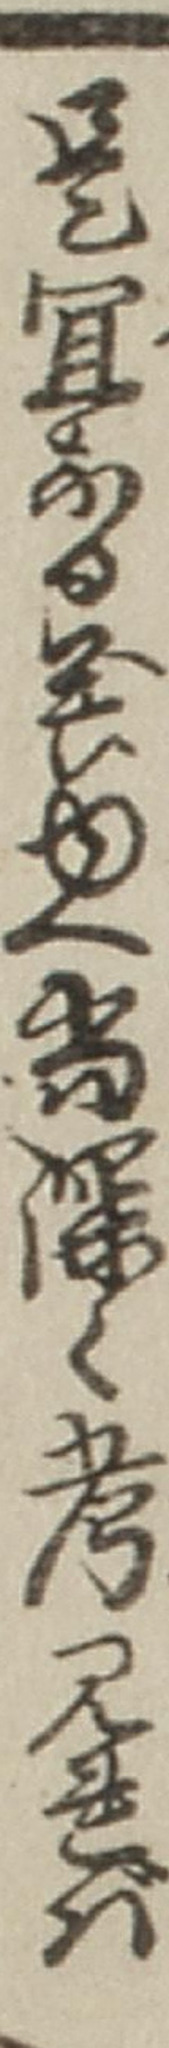是冝なる義ゆへ尚深く考見れば
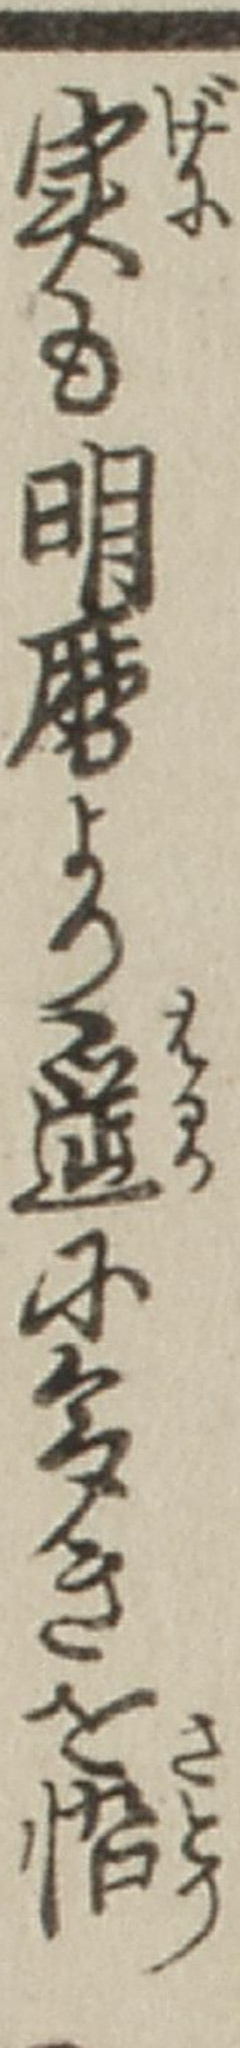実も明暦より遥に多きを悟
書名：安政見聞誌　下
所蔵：東京大学地震研究所図書室 Earthquake Research Institute Library, The University of Tokyo, JAPAN
